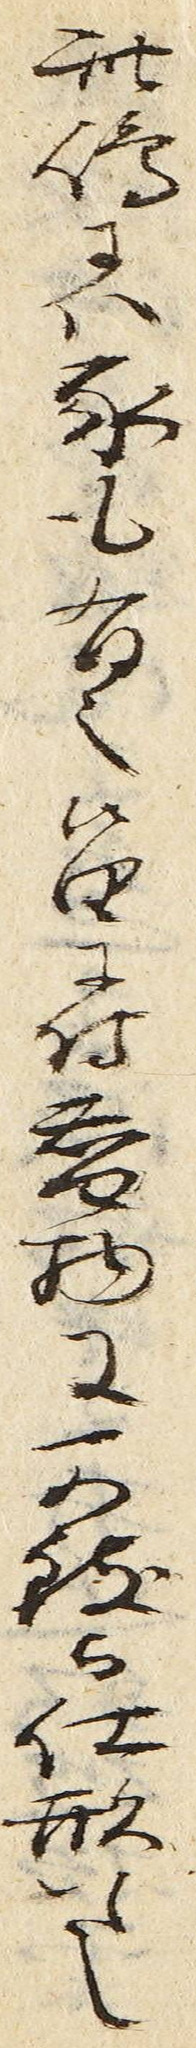此島には豕も有之候由に付替物に可致と仕形いたし
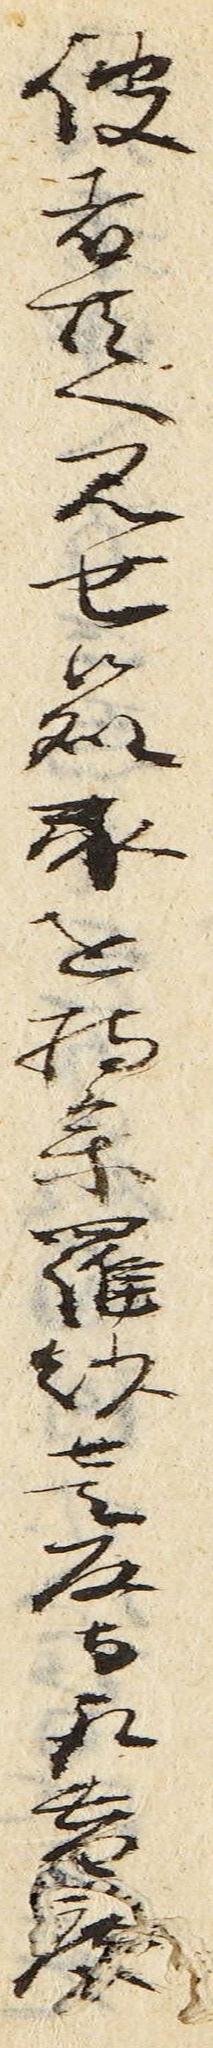彼者共へ見せ候処豕を持参羅紗壱反と取替度
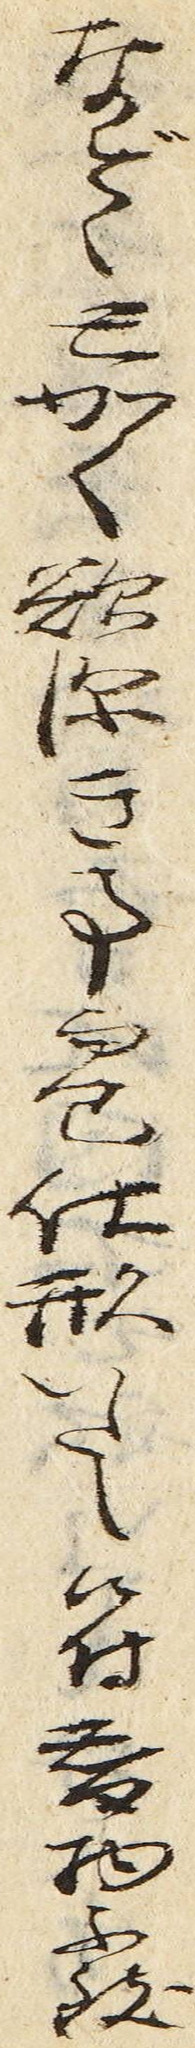などゝとかく欲深き事而已仕形いたし候付替物不致
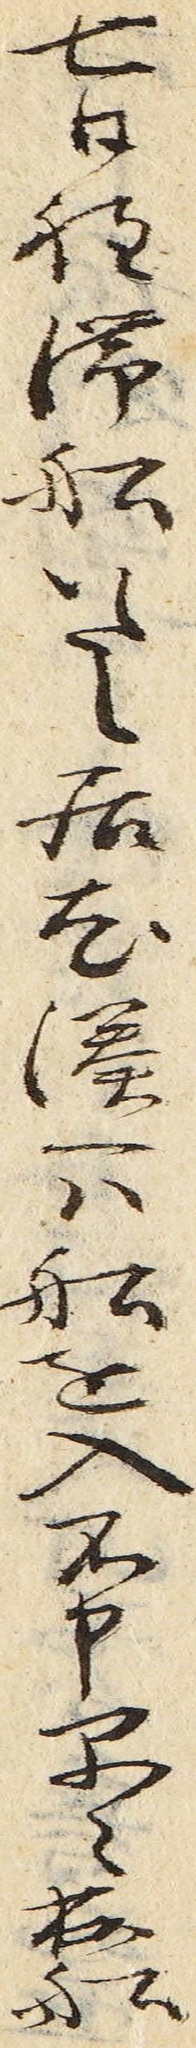七日程滞船いたし居尤湊へは船を入不申早々出船
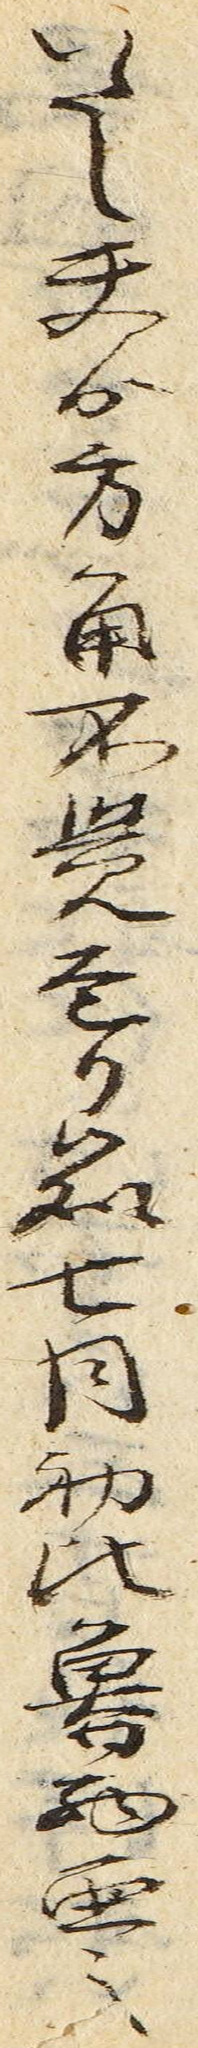いたし夫ゟ方角不覚走り候処七月初比魯西亜之

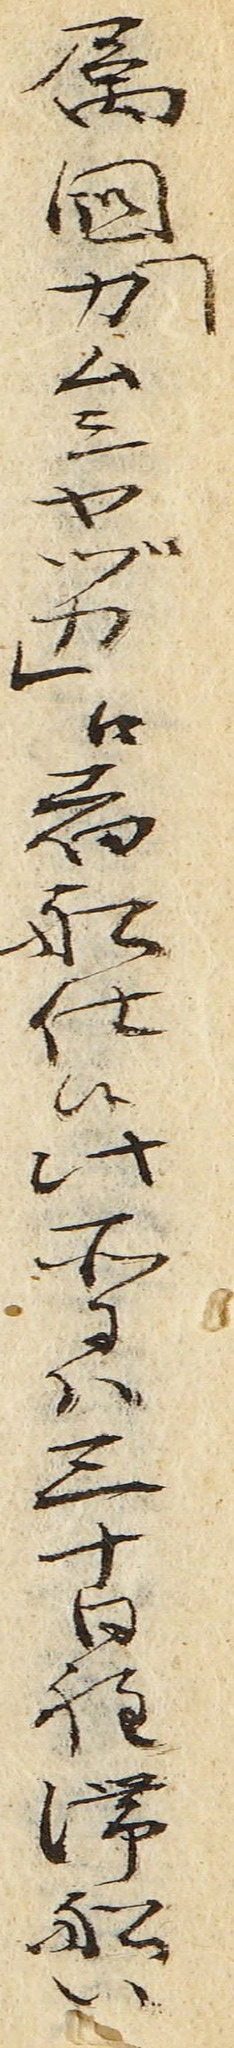属国「カムシヤヅカ」え着船仕候此所には三十日程滞船い
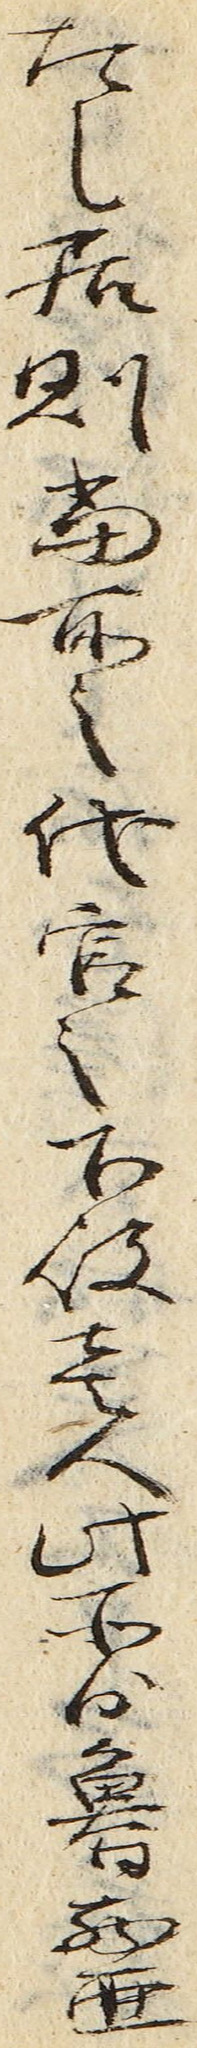たし居則当所之代官之下役壱人此所ゟ魯西亜
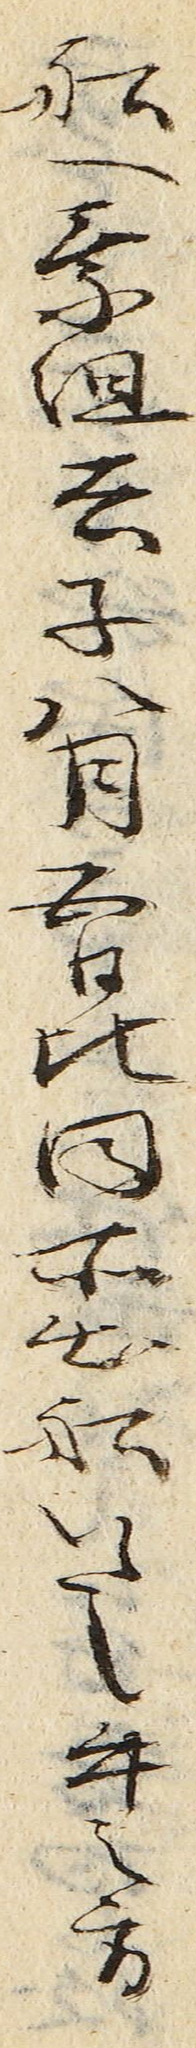船へ乗組去子八月五日比同所出船いたし午之方
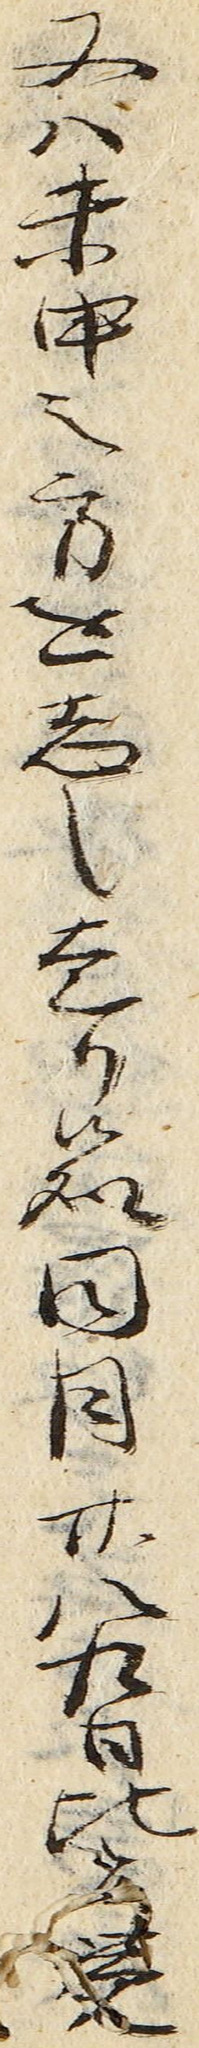又は未申之方を志し走り候処同月廿八九日比と覚
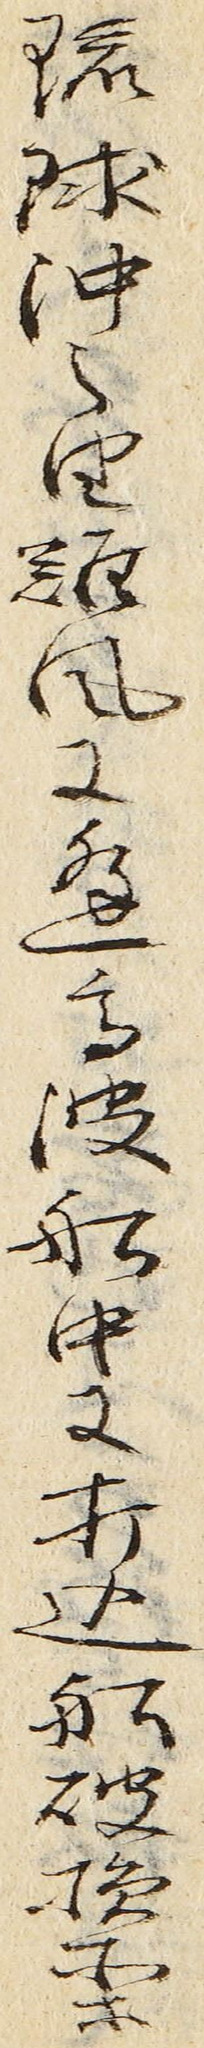琉球沖之由難風に逢高波船中に打込船破損所等
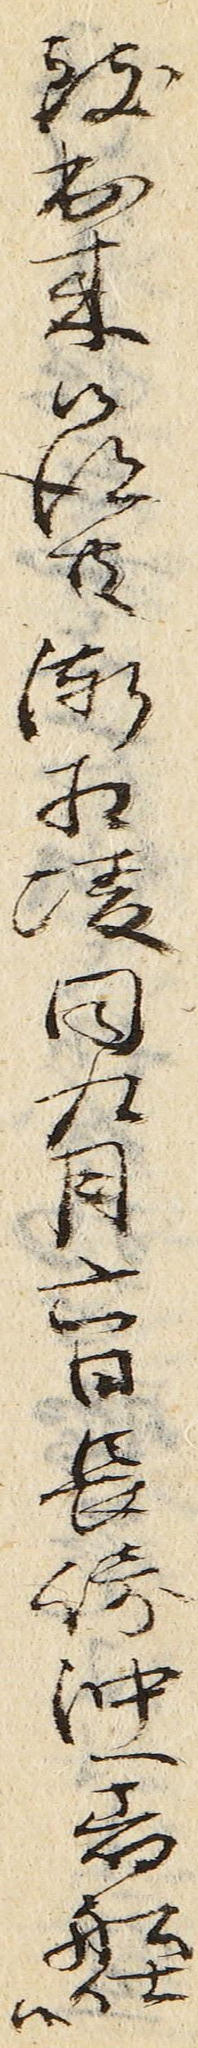致出来候得共漸相凌同九月六日長崎沖へ着船仕候
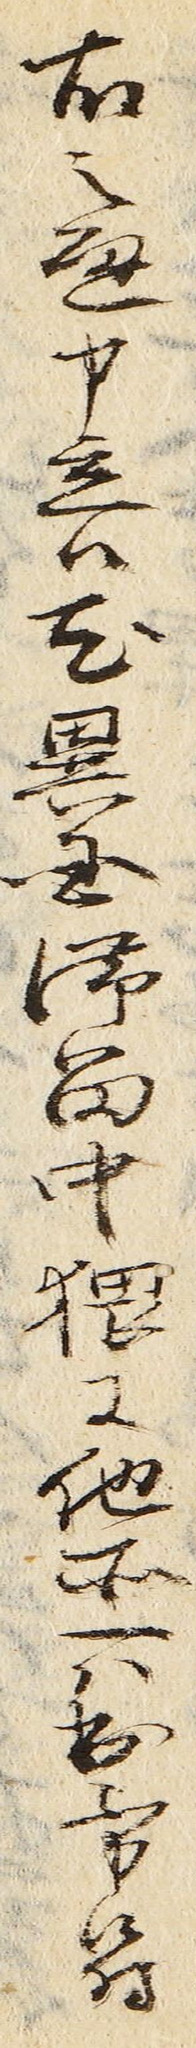右之通申立候尤異国滞留中猥に他所へは出不申候付
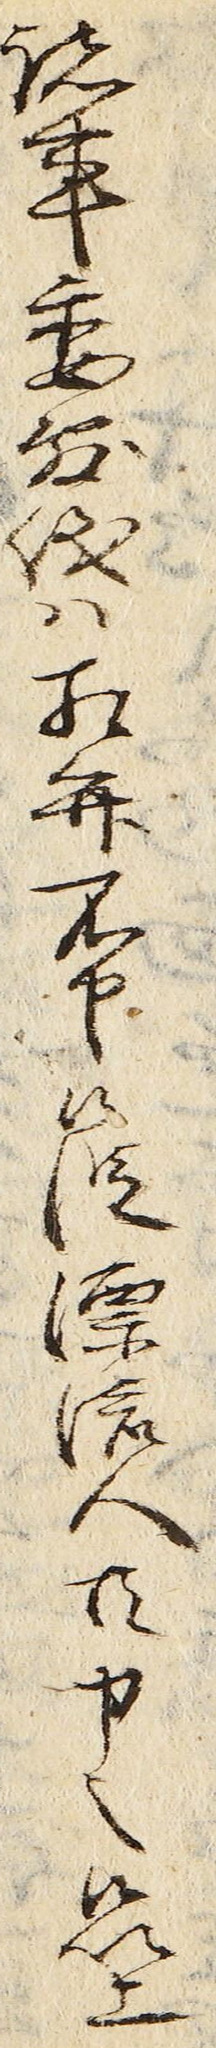諸事委敷儀は相弁不申候段漂流人共申之候以上
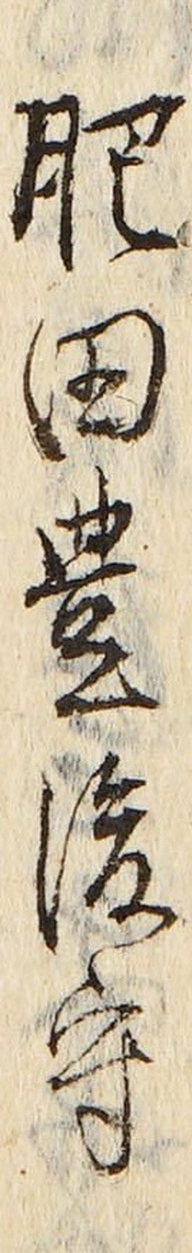肥田豊後守
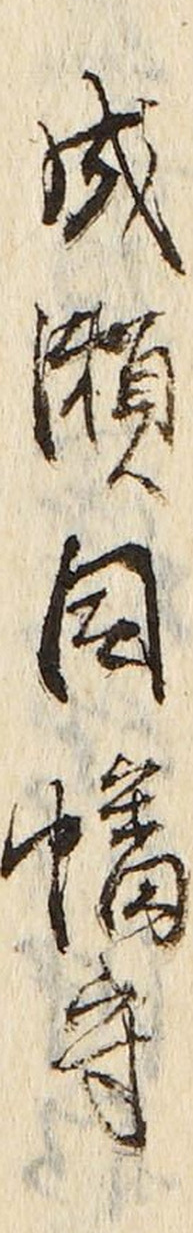成瀬因幡守

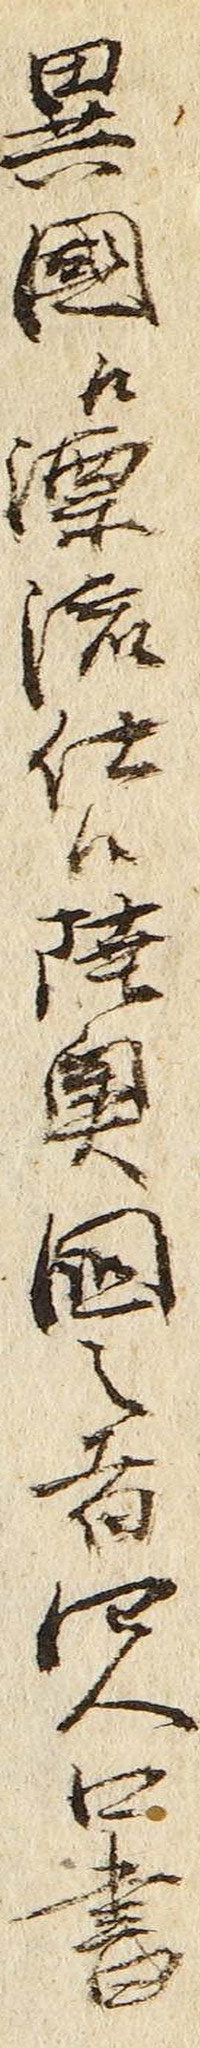異国え漂流仕候陸奥国之者四人口書
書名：漂民後記
